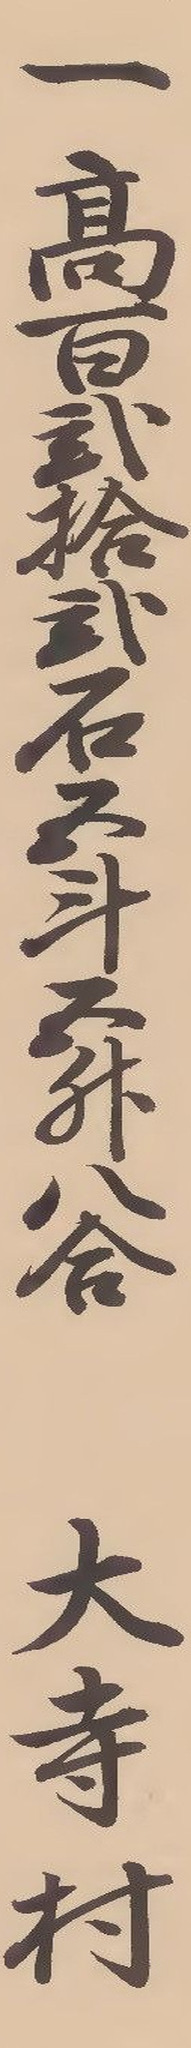一高百弐拾弐石五斗五升八合大寺村
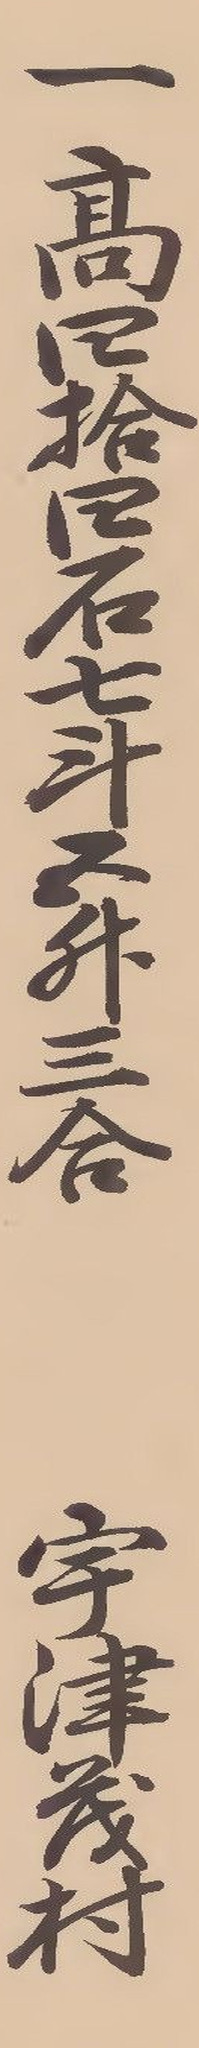一高四拾四石七斗五升三合宇津茂村
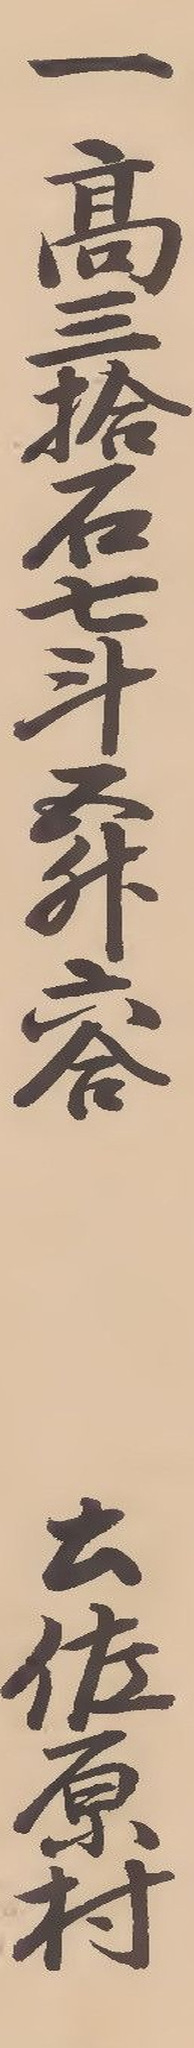一高三拾石七斗五升六合土佐原村
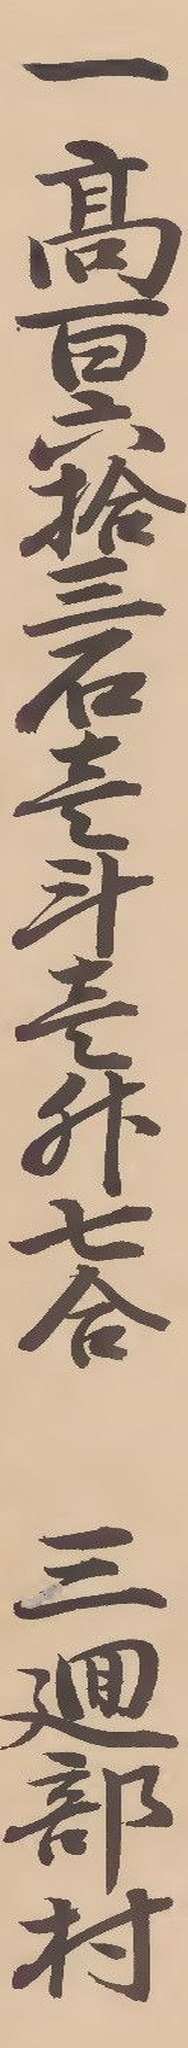一高百六拾三石壱斗壱升七合三廻部村
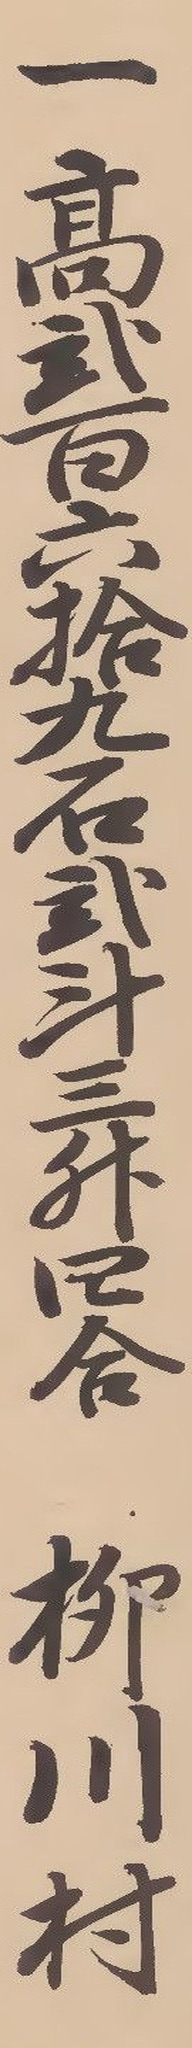一高弐百六拾九石弐斗三升四合柳川村
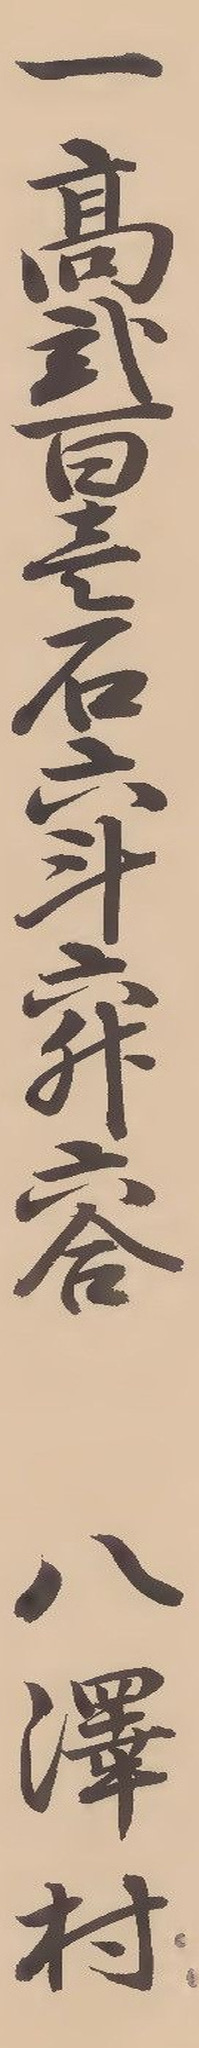一高弐百壱石六斗六升六合八澤村
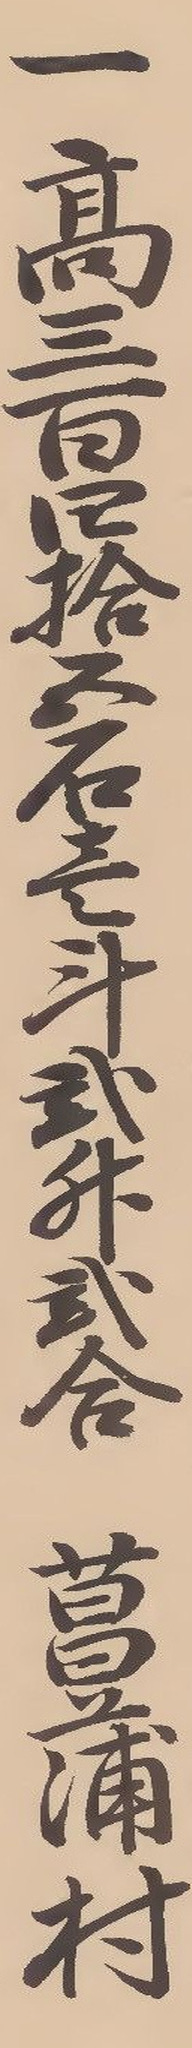一高三百四拾五石壱斗弐升弐合菖蒲村
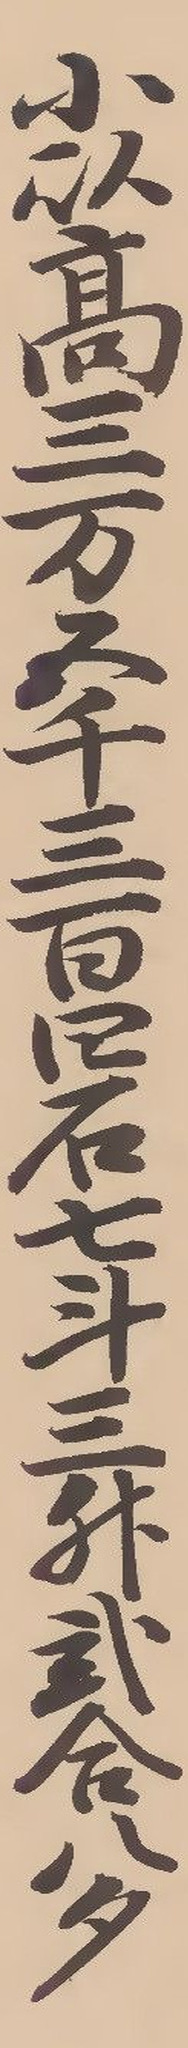小以高三万五千三百四石七斗三升弐合八勺

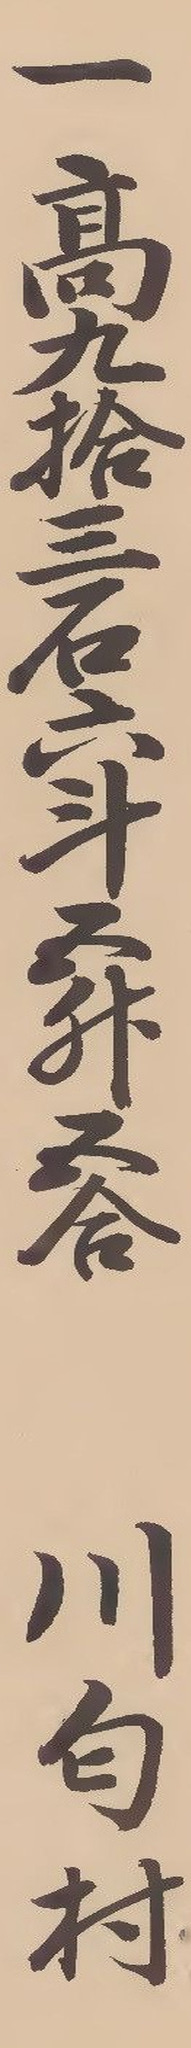一高九拾三石六斗五升五合川匂村
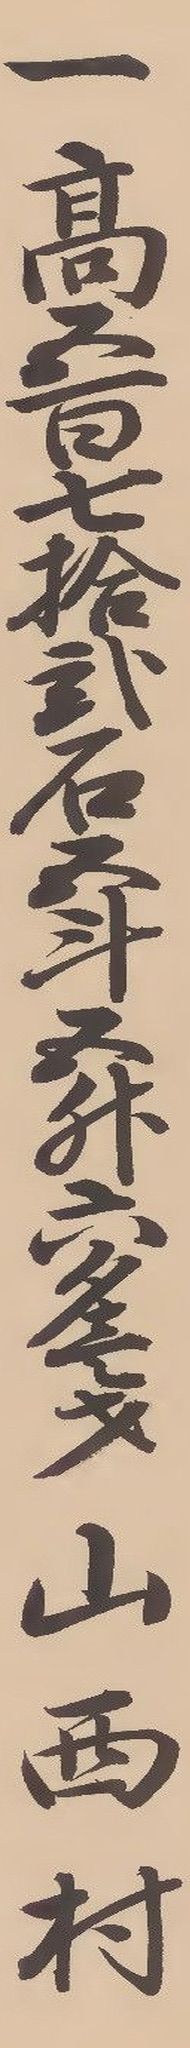一高五百七拾弐石五斗五升六勺七才山西村
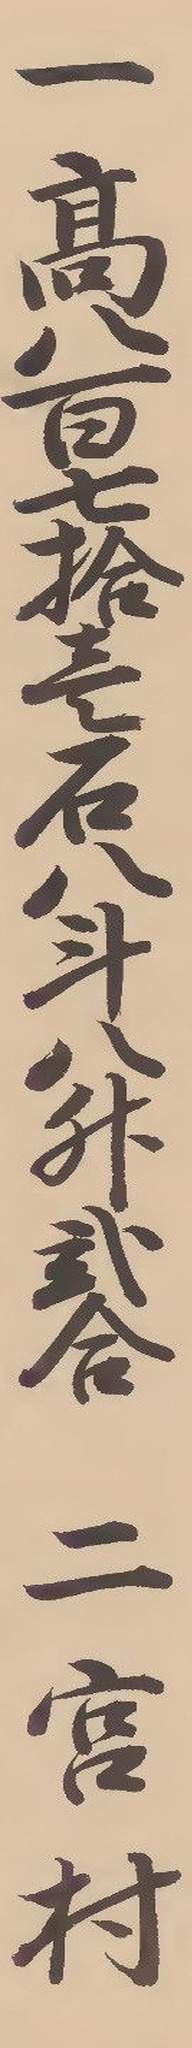一高八百七拾壱石八斗八升弐合二宮村

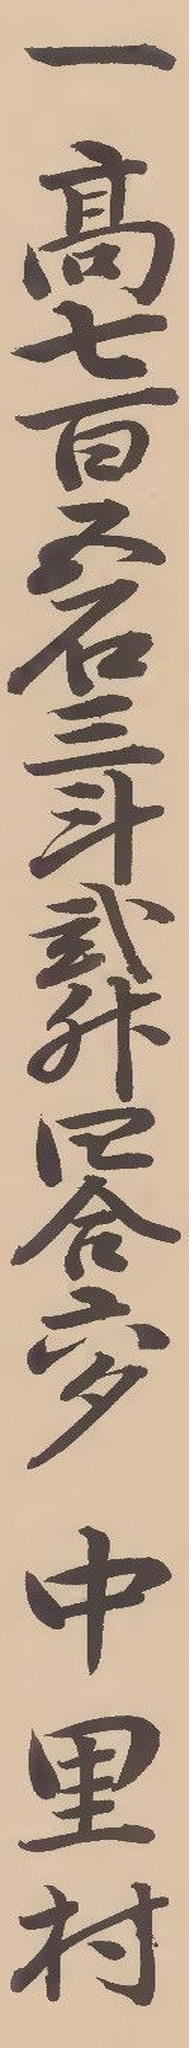一高七百五石三斗弐升四合六勺中里村
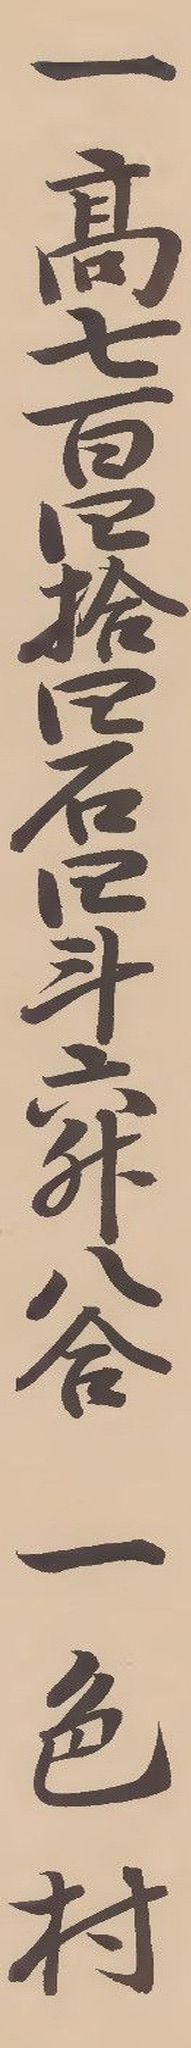一高七百四拾四石四斗六升八合一色村
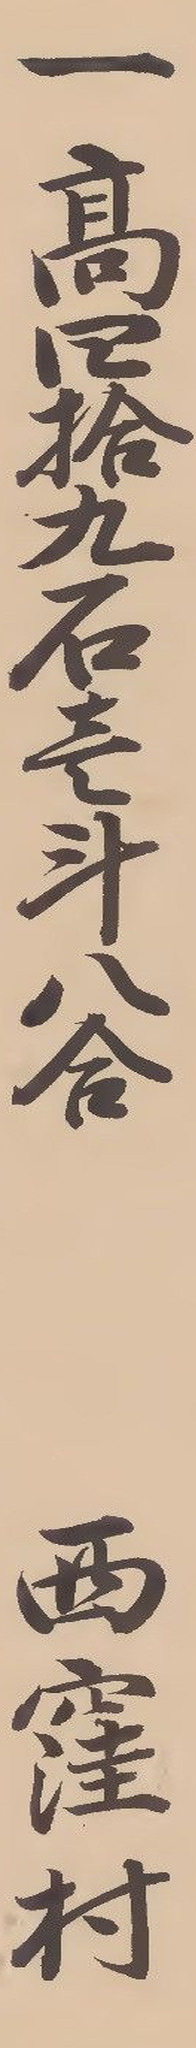一高四拾九石壱斗八合西窪村
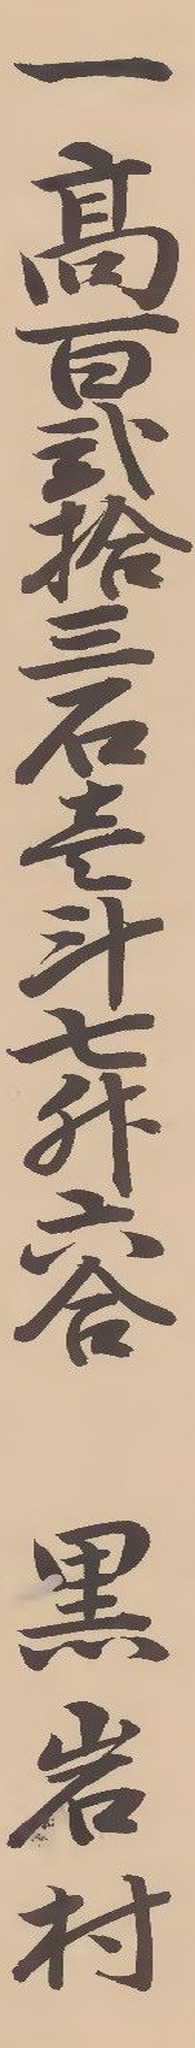一高百弐拾三石壱斗七升六合黒岩村
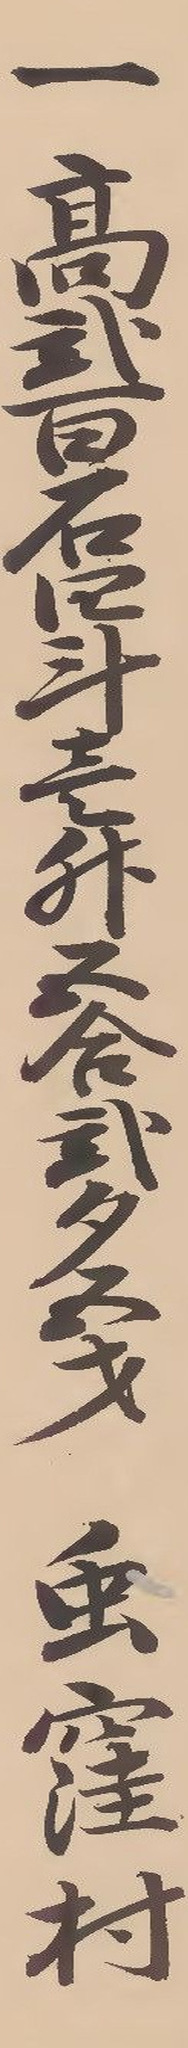一高弐百石四斗壱升五合弐勺五才虫窪村
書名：相模国郷帳
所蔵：国立公文書館 National Archives of Japan
